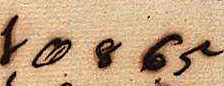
1$865
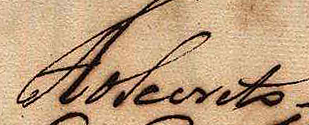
Ao Secreto.
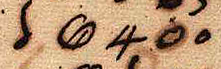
1$400
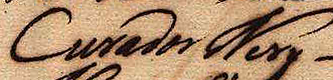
Curador Nery
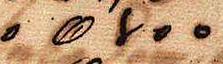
0$100
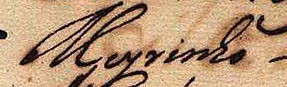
Meyrinho
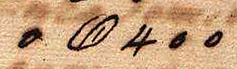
0$400
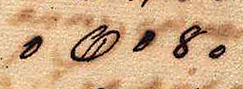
0$080
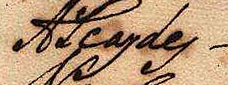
Alcaydes
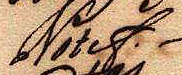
Notef.
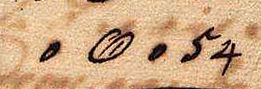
0$054
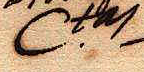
C.tas
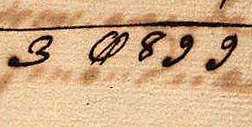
3$899
